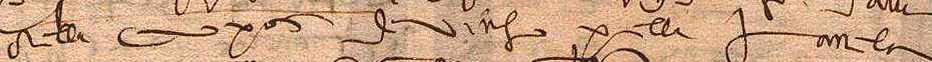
A ella copos de vinho pella Janela
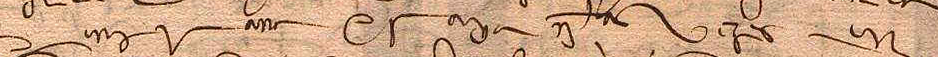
e entraua e saya mtas vezes em
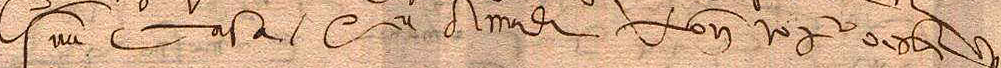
sua Casa / e eu Amador Roiz notro o esc̄vy
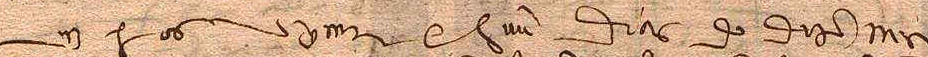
em hos vymte e huū dias do dito mes
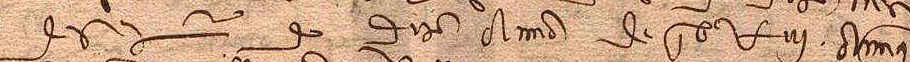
de setro do dito Anno de j̄ bc Riij . Annꝯ
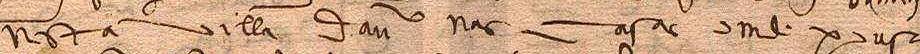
nesta villa dauro nas casas omde pousa
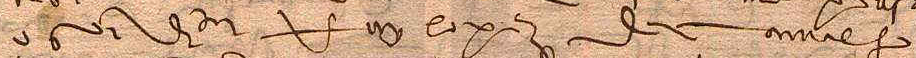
o sor̄ dtor Ruy lopez de carualho
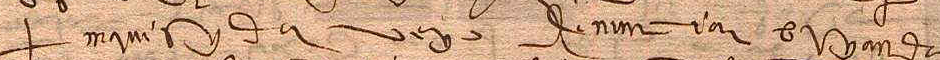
Jmquisydor veyo denunciar bryanda
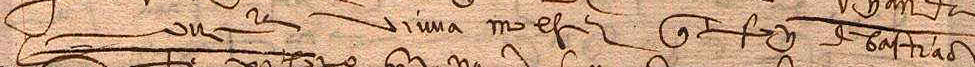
Coucra viuua molher q̄ foy de bastiaõ
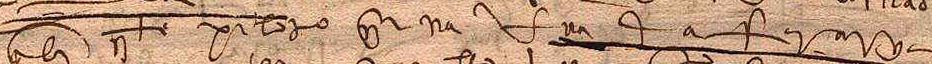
ālz mte piloto mor na Rua da ferarya
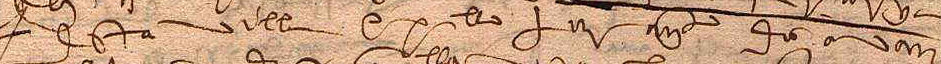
desta villa e pello Juramto dos avam
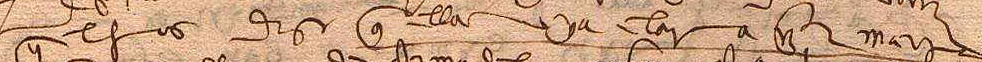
gelhos dise q̄ ella vya claramte marta
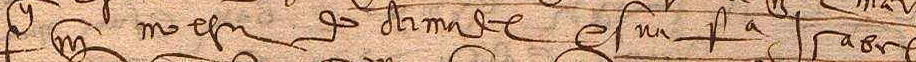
fr̄rz molher do Armadel e sua fa Jsabel
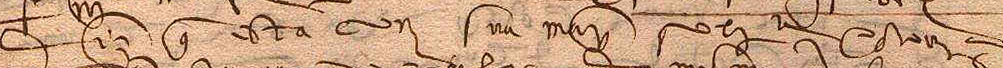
dīz q̄ esta com sua mãy soltra e A outas
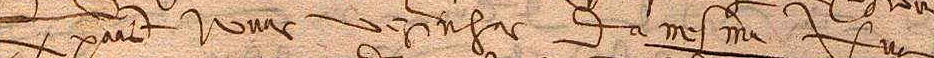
Xpaās nouas vezinhas da mesma Rua
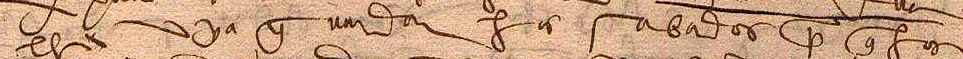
lhes vya guardar hos sabados p̄o q̄ hos
